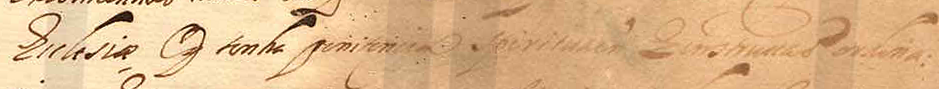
Ecclesiæ, q̄ tenha penitencias spirituaes E instrussaõ ordina
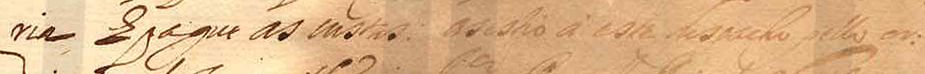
ria, E pague as custas asistio a este despacho pello or
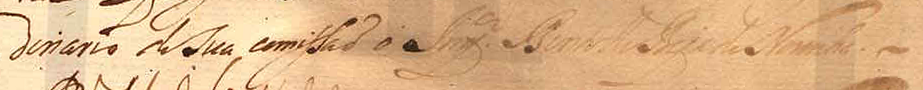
dinario de sua comissaõ o Inq.or Bento de Beja de Noronha. -
